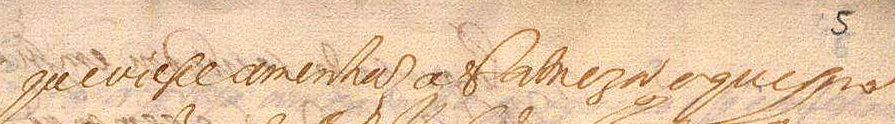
que viesse amenhā a esta meza o que pro
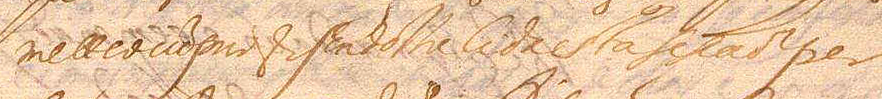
metteo cūprir e sendolhe lida esta sessaõ per
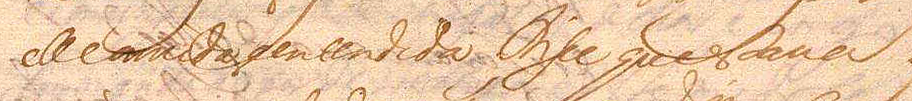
elle ouuida e entendida Disse que estaua
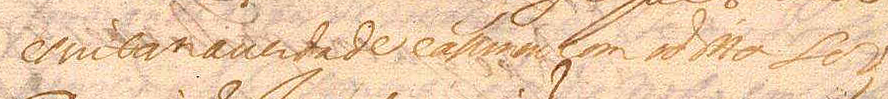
escrita na uerdade e assinou com o ditto sor
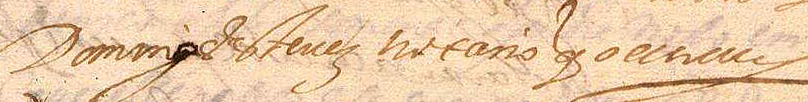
Domingos esteuez notario q̄ o escreuy
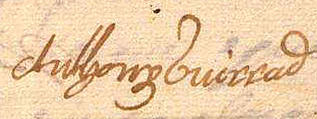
Anthony Guirrad
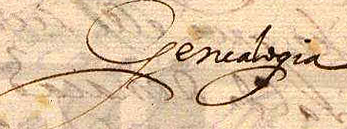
Genealogia
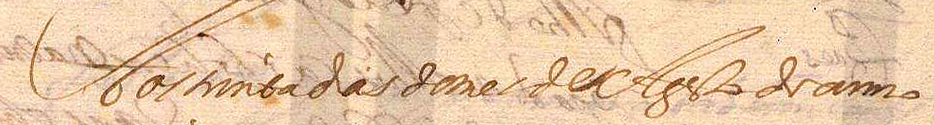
Aos trinta dias do mes de Agosto do anno
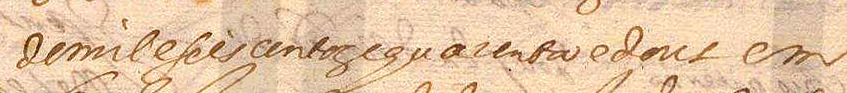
de mil e seiscentos e quarenta e dous em
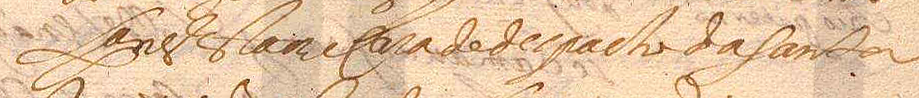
Lxa nos estaos e Caza do despacho da santa
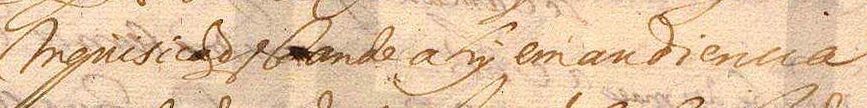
Inquisiçaõ estando ahy em audiencia
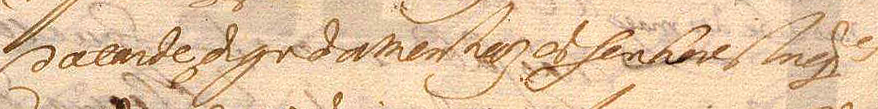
da tarde digo da menhā os senhores Inqres
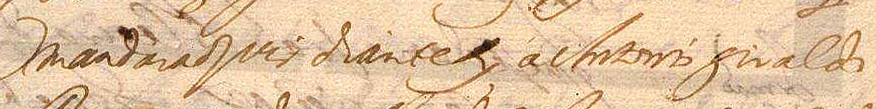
mandaraõ vir diante sy a Antonio giraldo
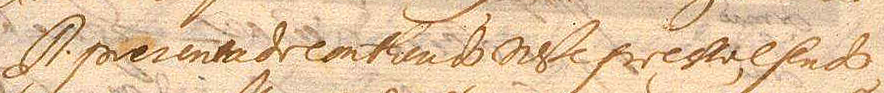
R. prezentado contheudo neste processo, e sendo
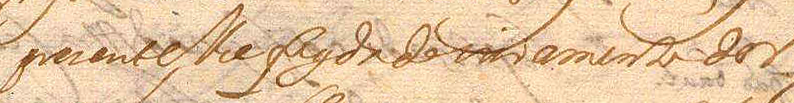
prezente lhe foy dado iuramento dos
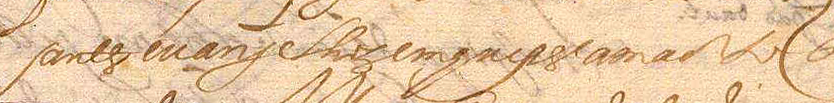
santos euangelhos em que pos a maõ sob
